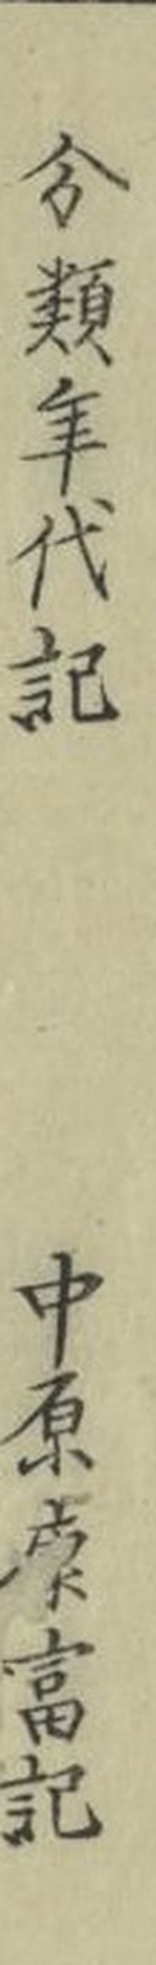分類年代記中原康富記

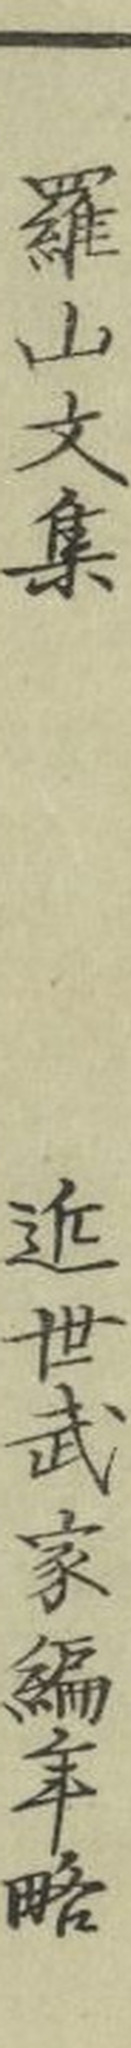羅山文集近世武家編年略
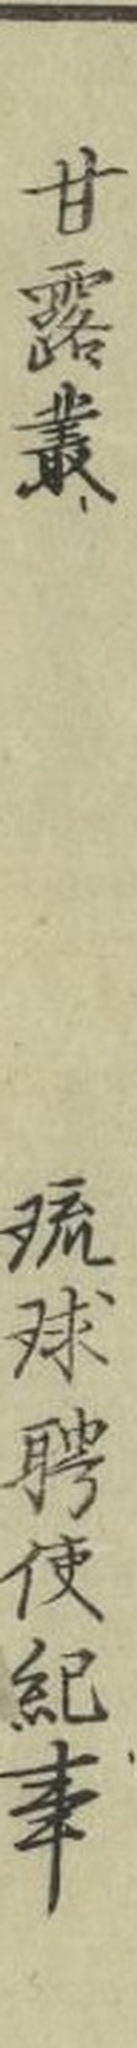甘露叢琉球聘使紀事
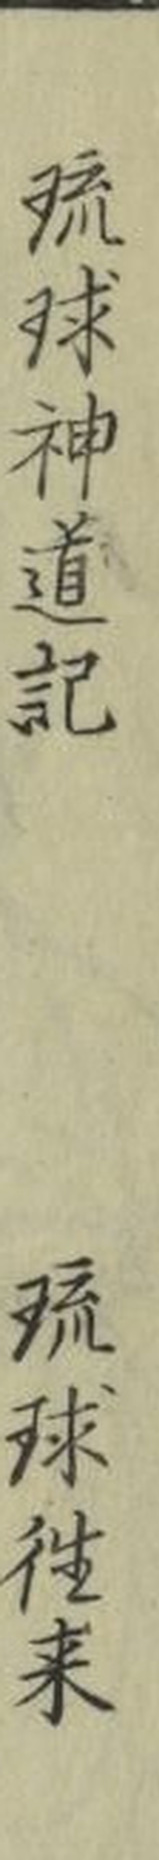琉球神道記琉球往来
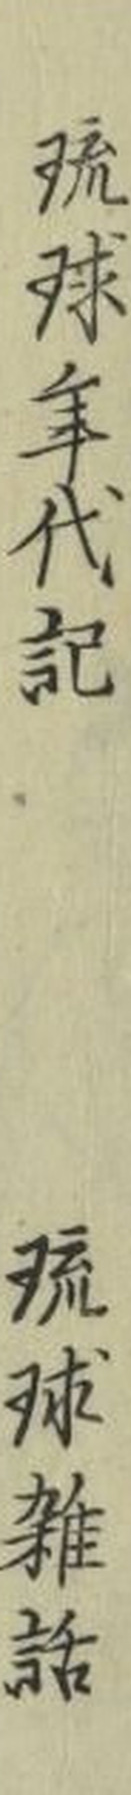琉球年代記琉球雑話

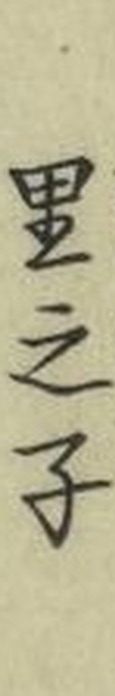里之子
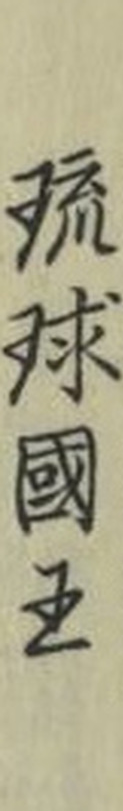琉球国王

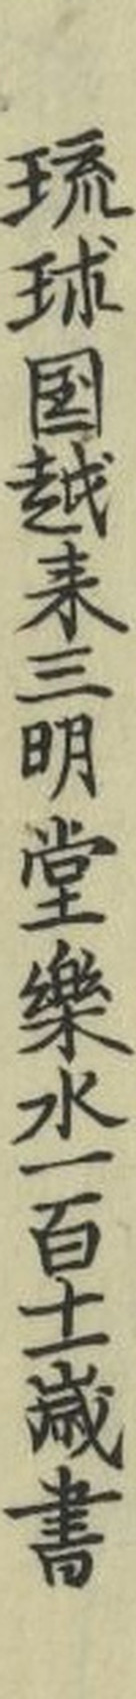琉球国越来三明堂楽水一百十一歳書
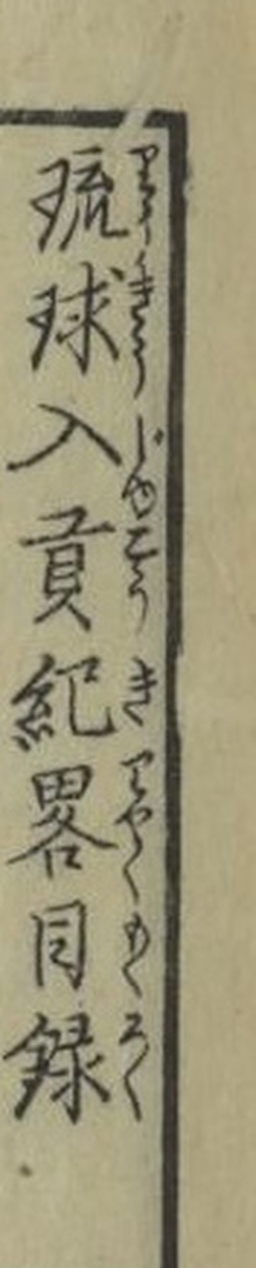琉球入貢紀略目録
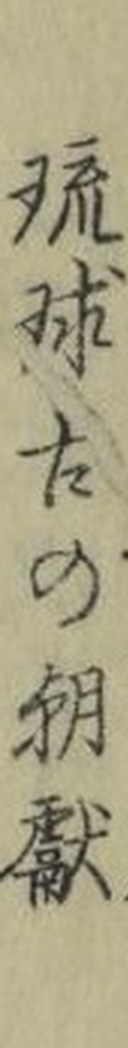琉球古の朝献
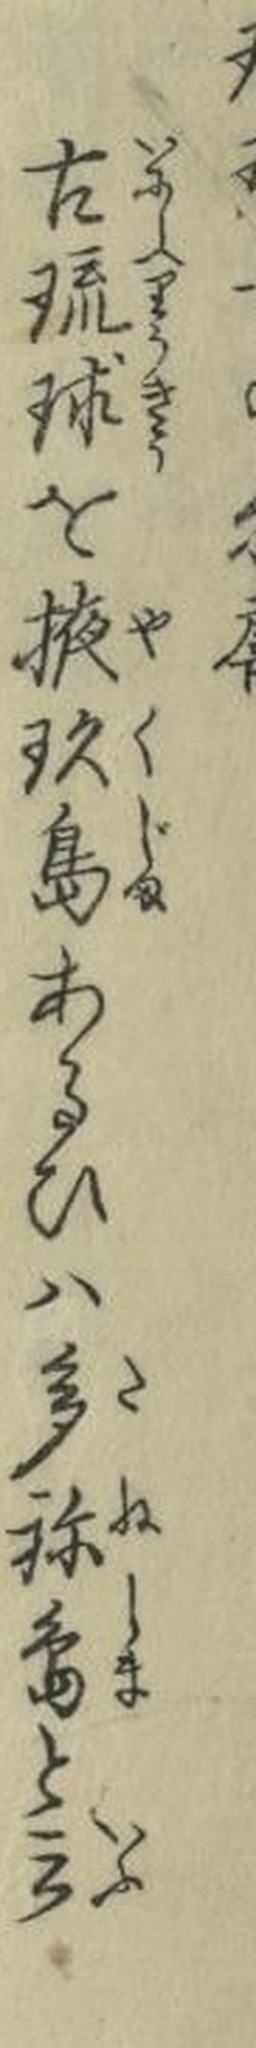古琉球を掖玖島あるひは多祢島と云
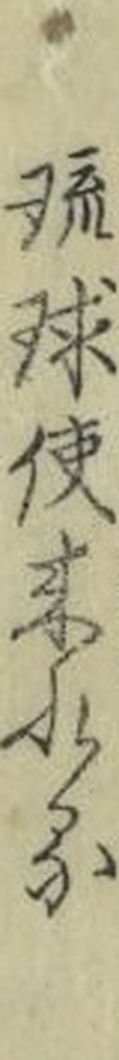琉球使来れる
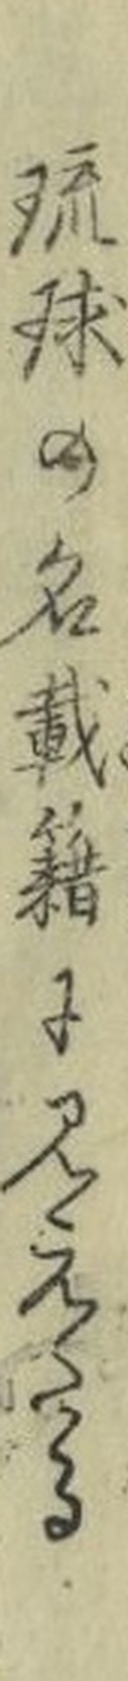琉球の名載籍に見えたる
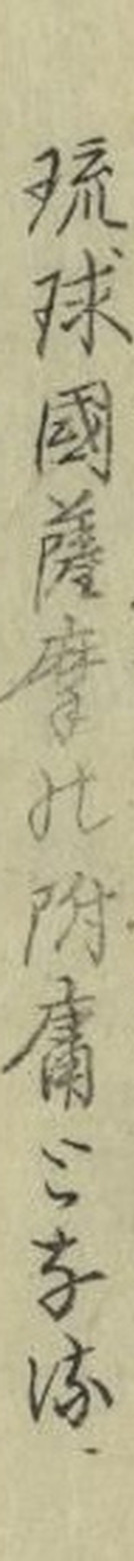琉球国薩摩の附庸となる
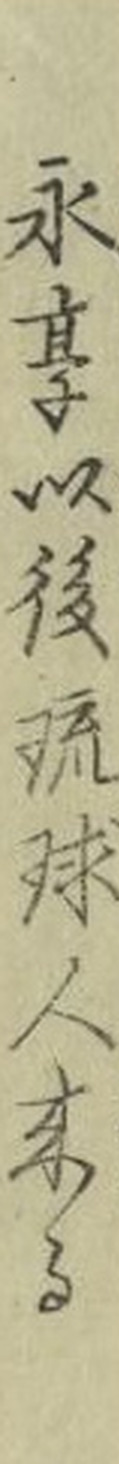永享以後琉球人来る
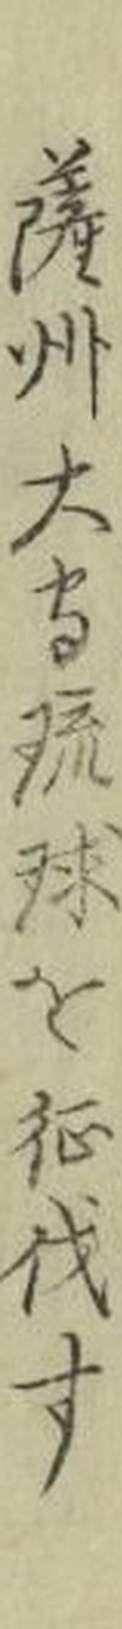薩洲大守琉球を征伐す
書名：琉球入貢紀略
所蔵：University of the Ryukyus Library
